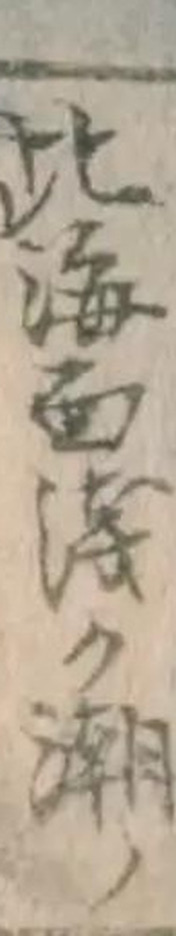此海面浅ク潮ノ
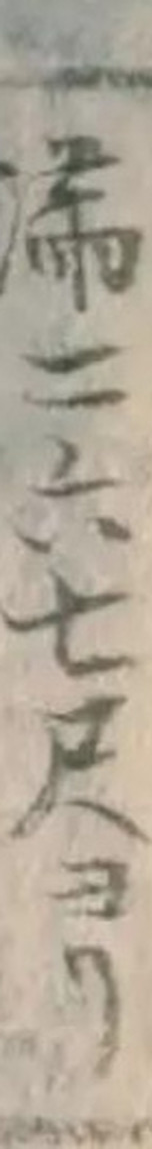満ニ六七尺ヨリ
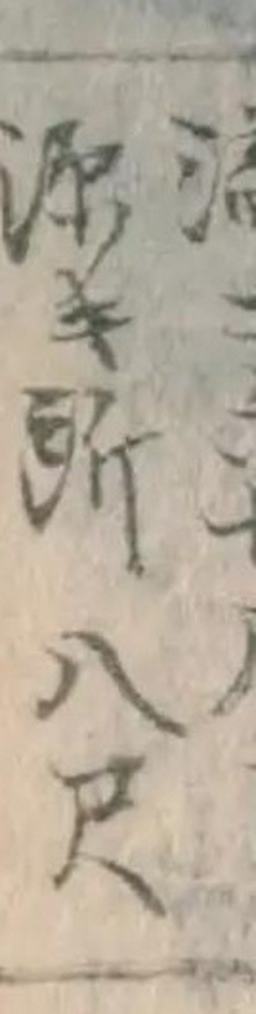深キ所八尺
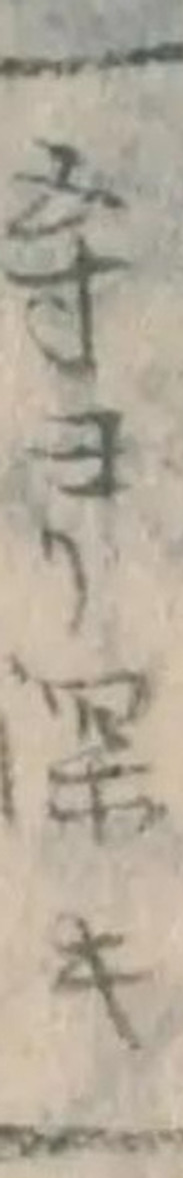五寸ヨリ深キ

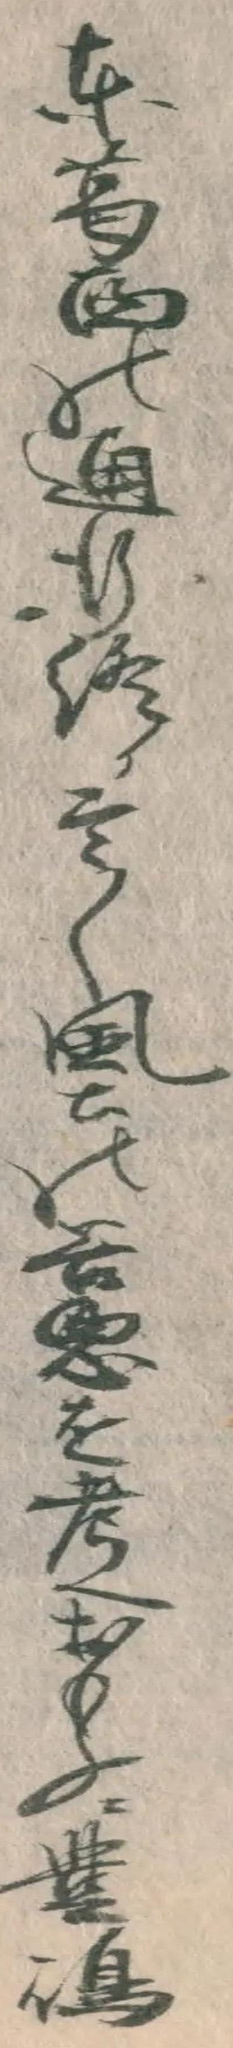東葛西の通行終り尽〳〵風土の善悪を考へおもふに豊島
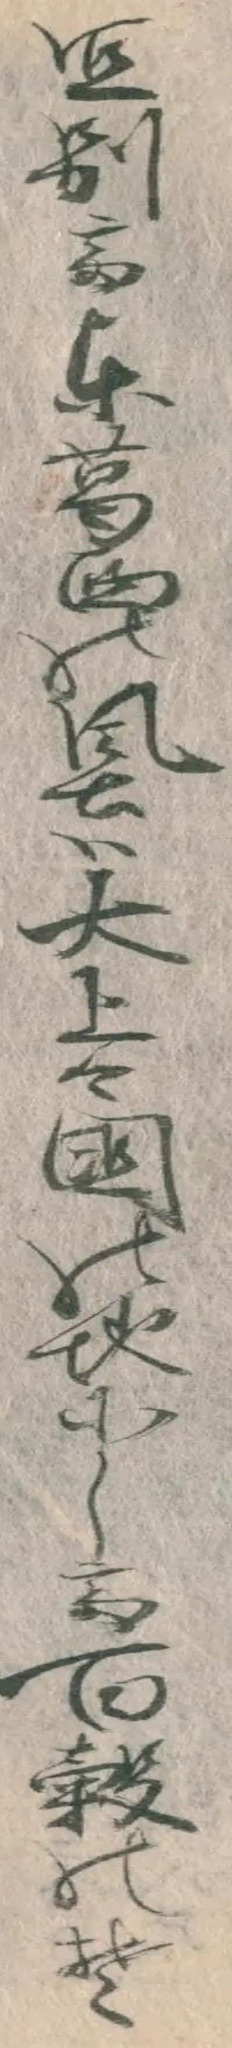宜別て東葛西の風土は大上々国の地にして百穀のそ
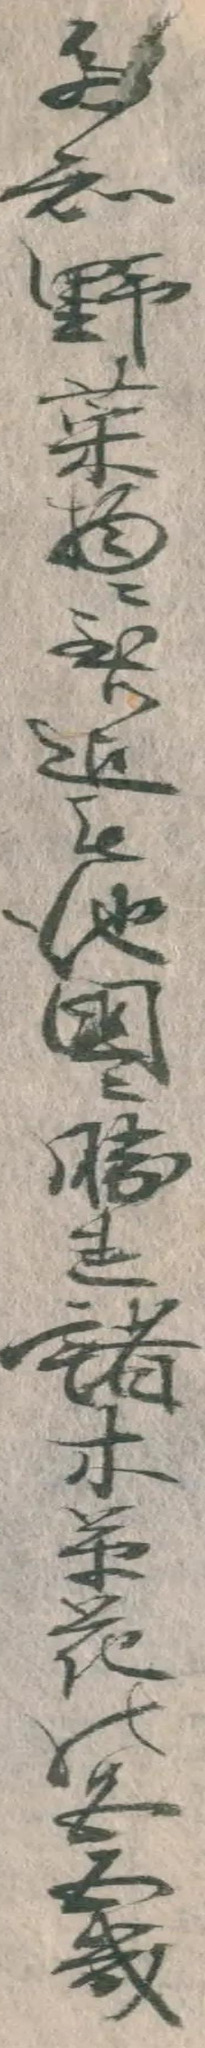たち野菜物に至る迄も他国に勝れ諸木草花の色五畿
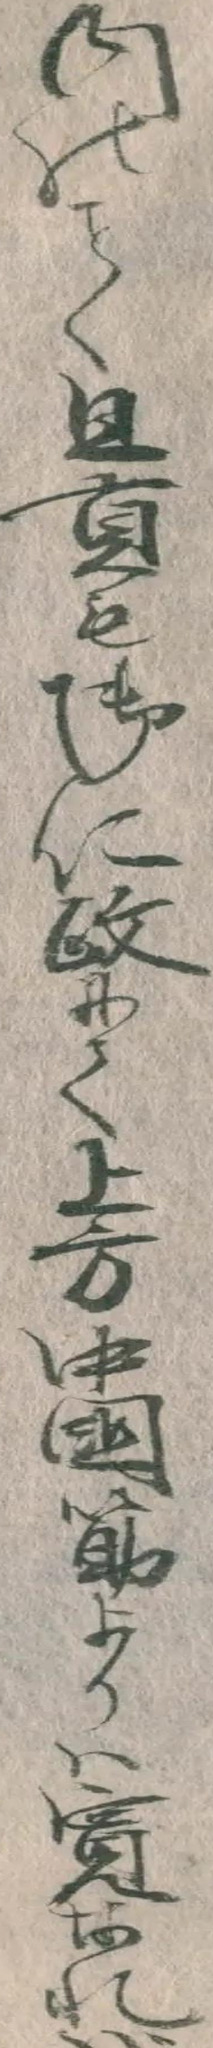内のことく且貢も御仁政にて上方中国筋よりは寛なれば
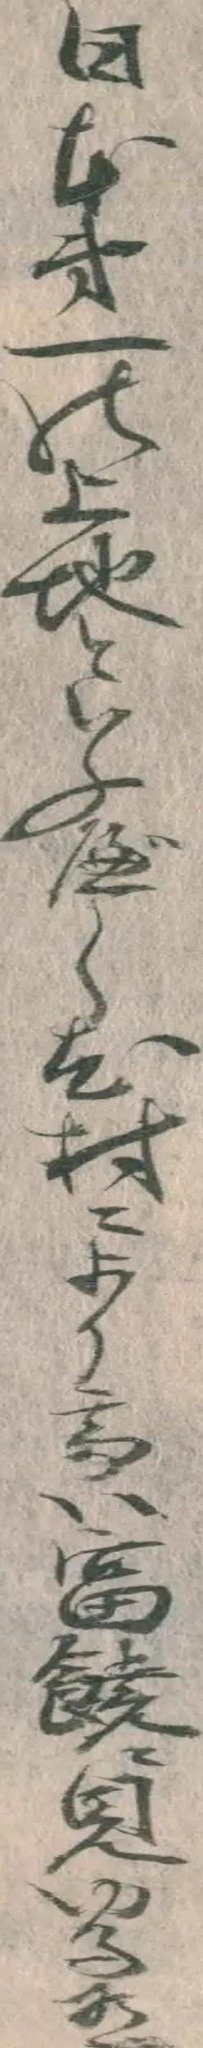日本第一の上地といふべし尤村によりては富饒に見ゆる有
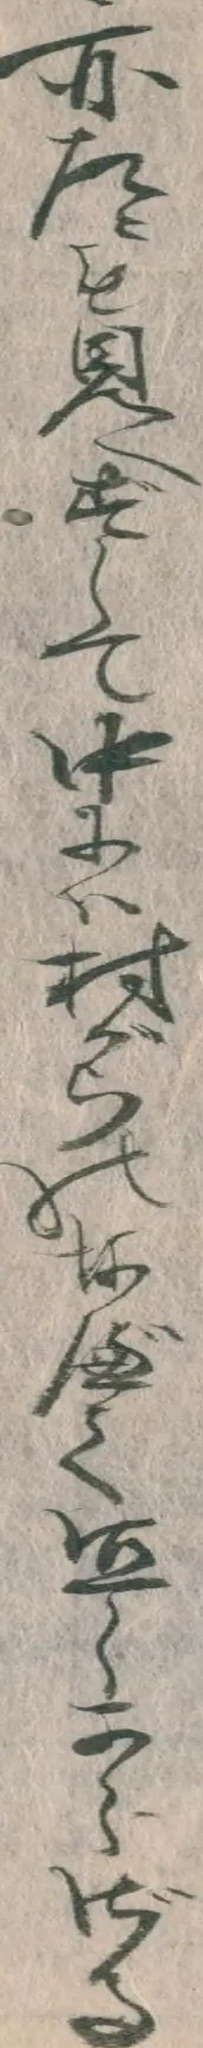亦左にも見へずして中には村がらのなべて宜しからざる
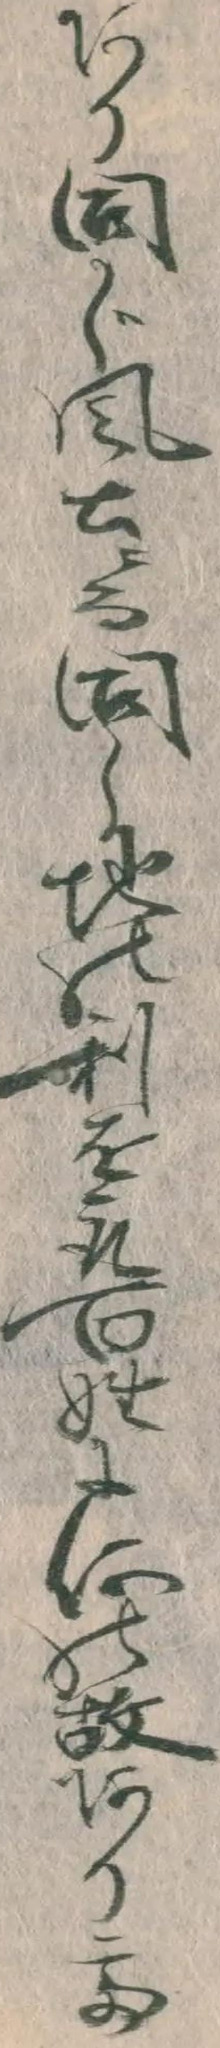あり同じ風土にて同し地の利を取百姓に何の故ありて
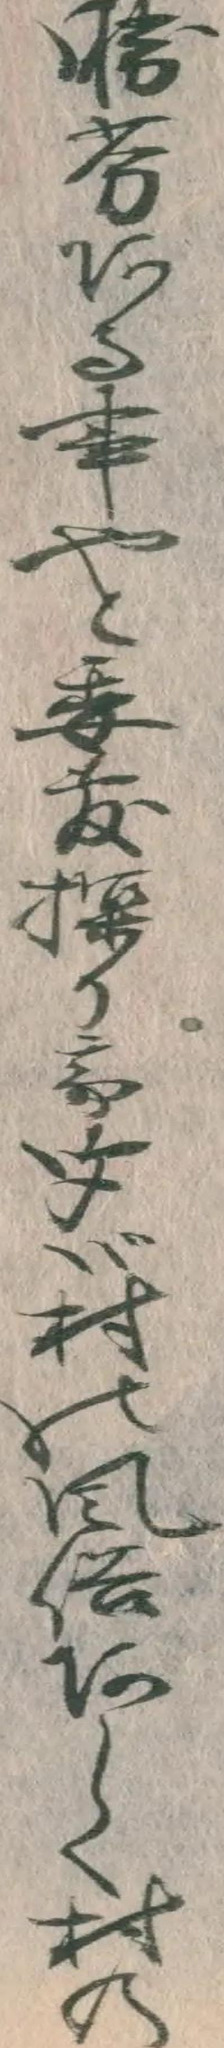勝劣ある事やと委敷探りて聞ば村の風俗あしく村の
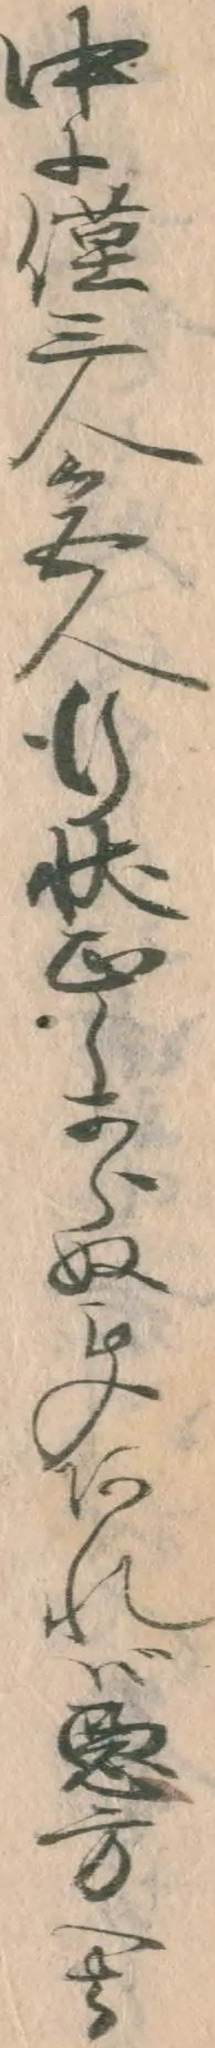中に僅三人か五人行状正しからぬものあれば悪方へは
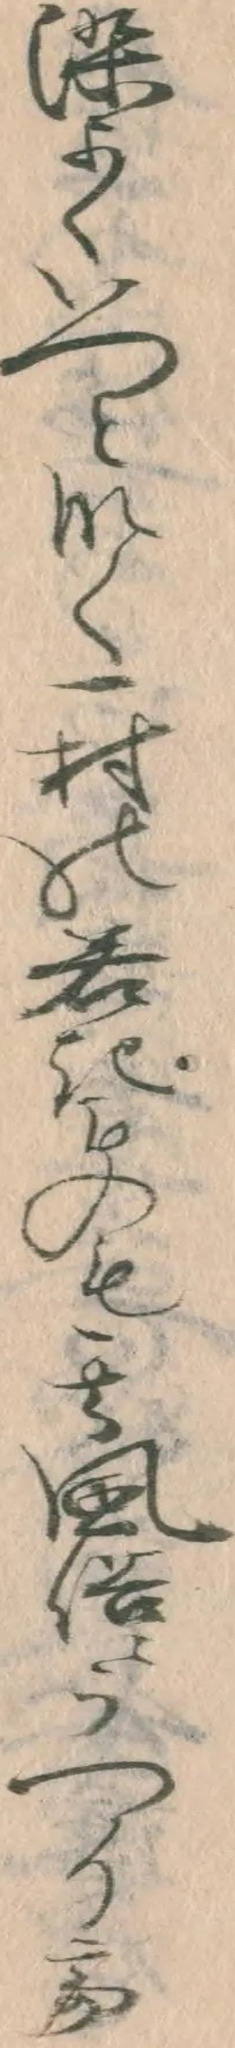染よくいつとなく一村の若きものも其風俗にうつりて
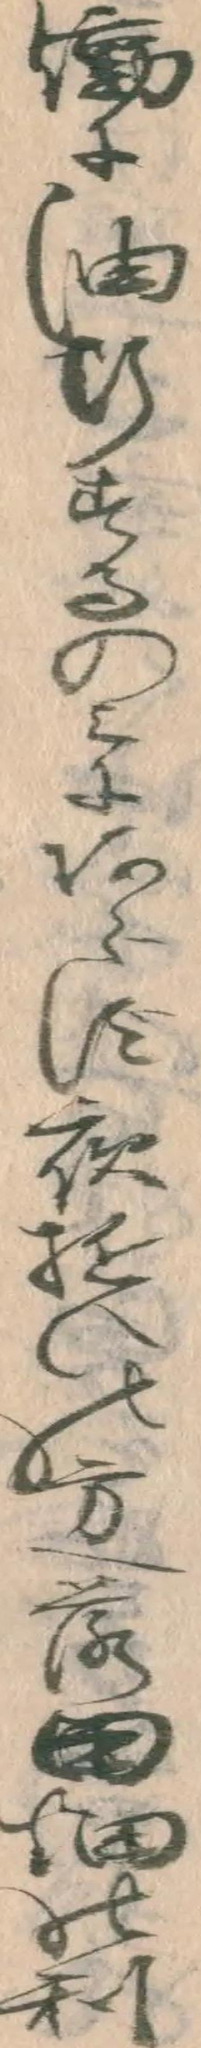働に油断するのみにあらず夜遊ひの方へ落田畑の利
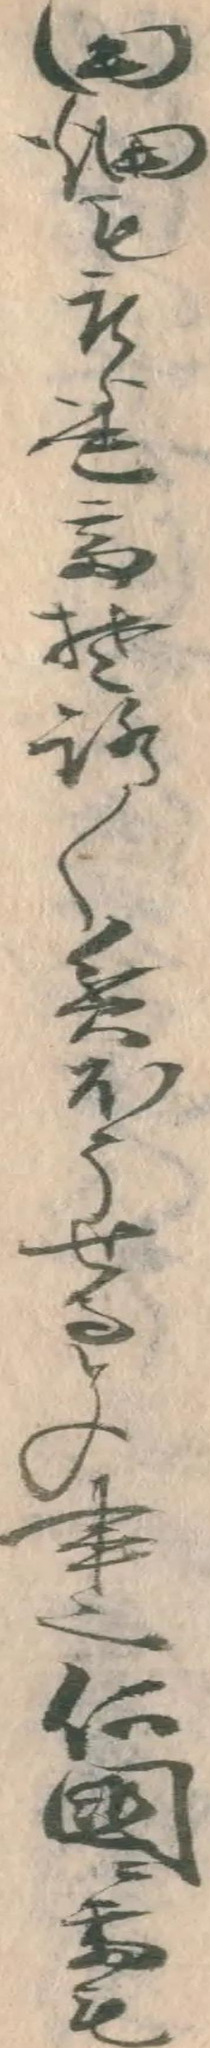田畑も取られてそろ〳〵貧ほうせるとの事也何国にても
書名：四神地名録 6巻. [4]葛飾郡
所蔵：国立国会図書館 National Diet Library, JAPAN
